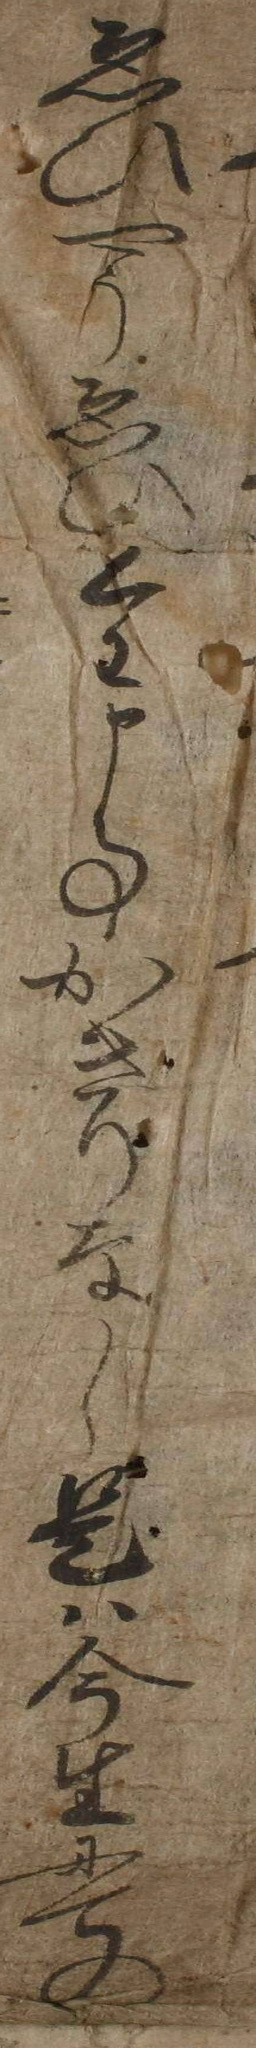ゑひやうゑひくわ申事かきけなし是は今生にての
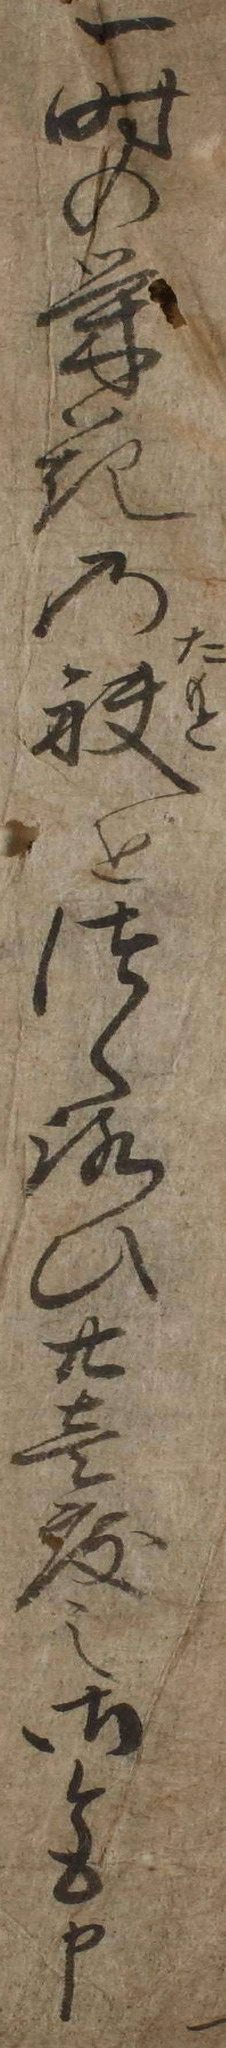一時の栄花の袂をつくろひ廿壱度之御とも申
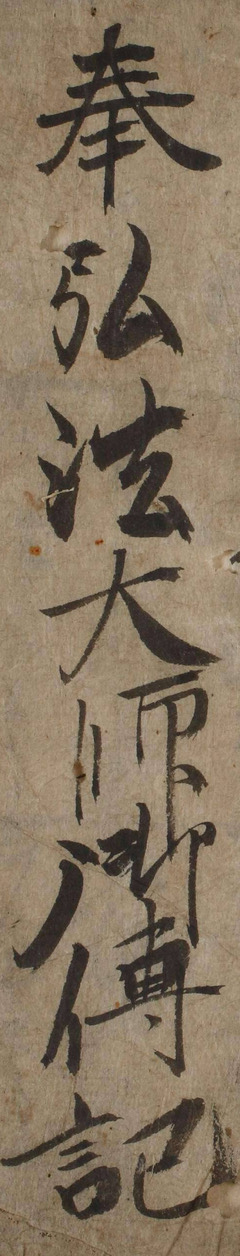奉弘法大師御傳記

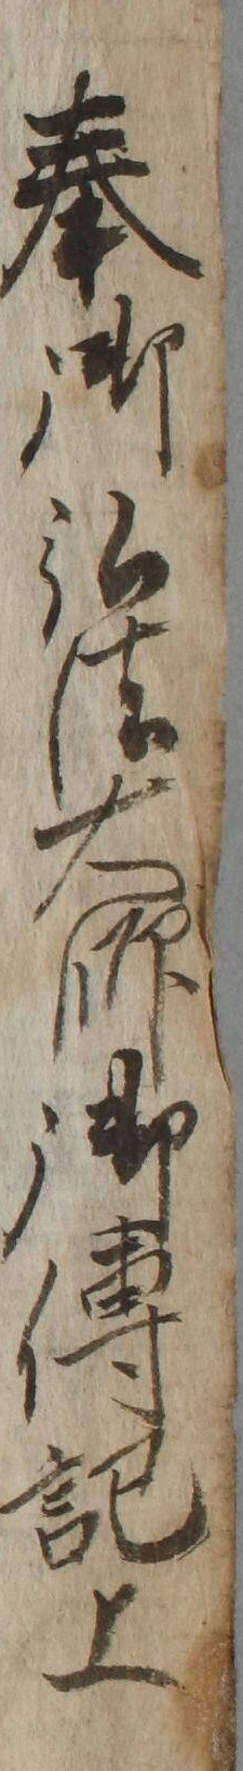奉御弘法大師御伝記上
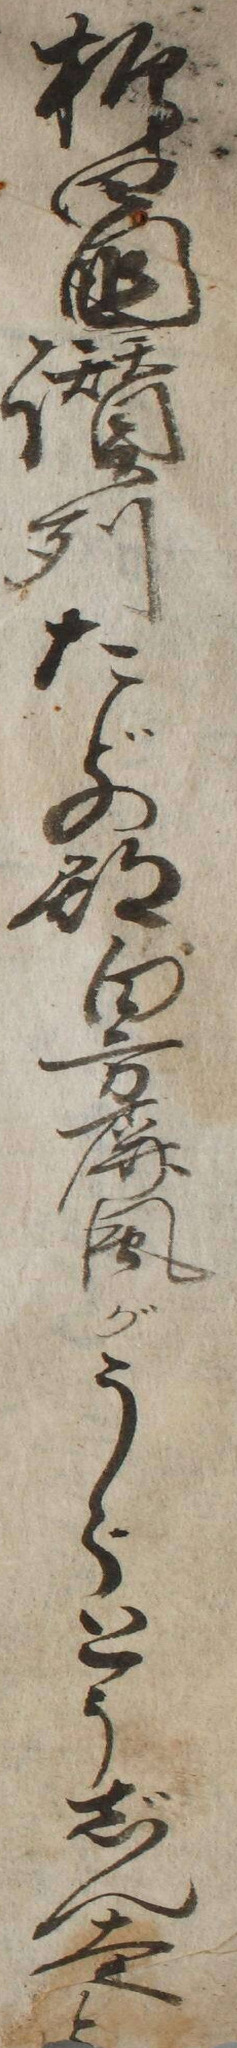抑四国讃州たどの郡白方屏風がうらとうじん太夫と
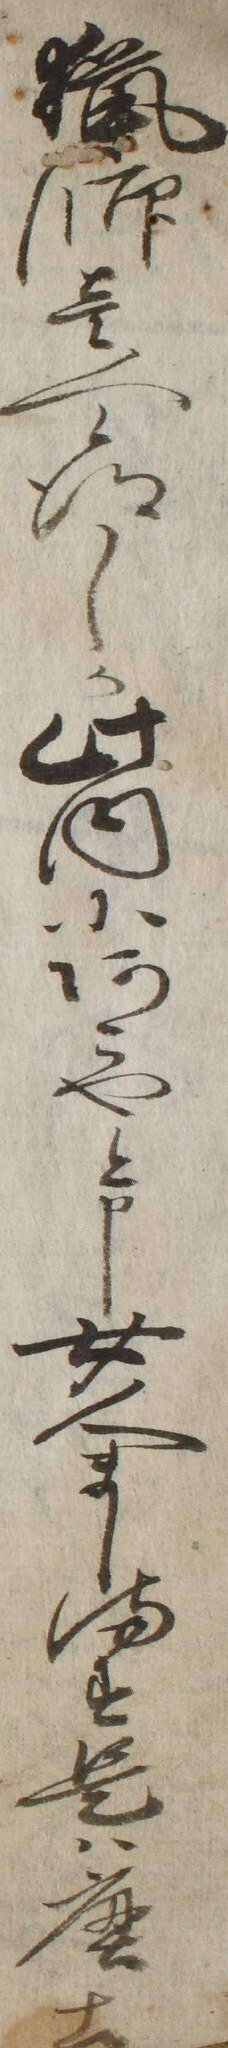猟師壱人候得しか此内にあこやと申女人まします是は唐土
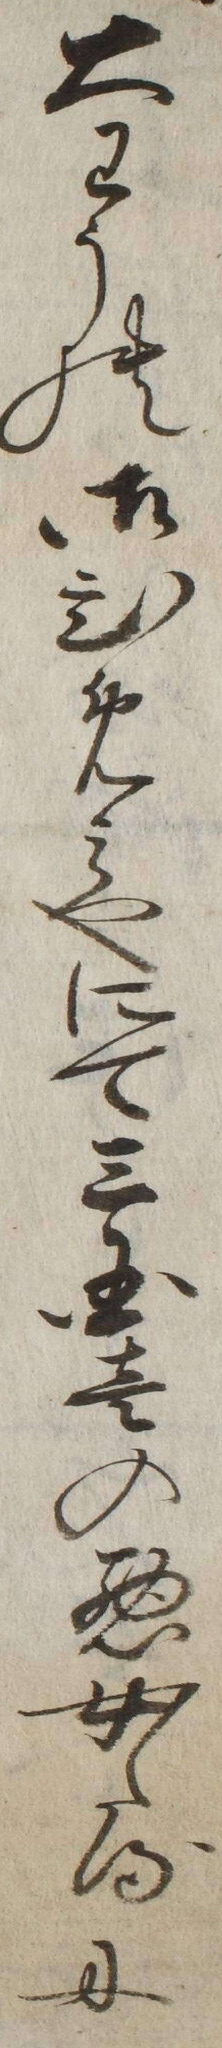大わうの御ひめみやにて三国壱の悪女たるに
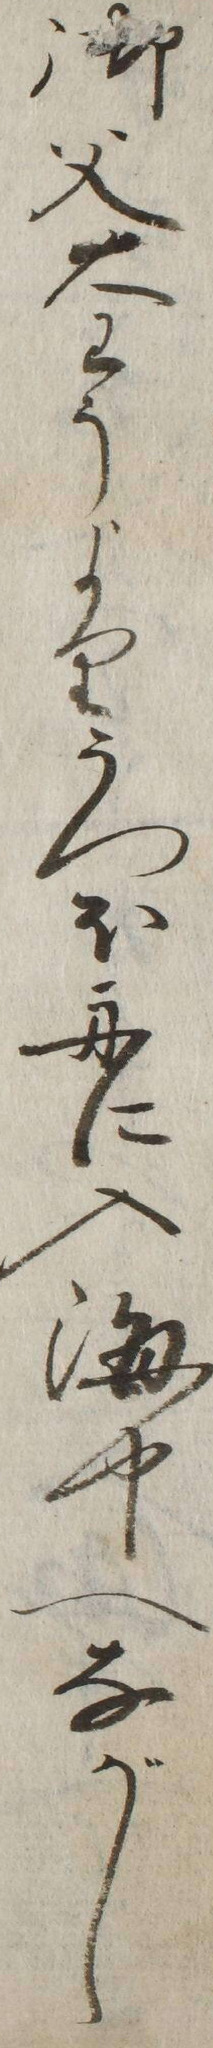御父大わうよりうつほ舟に入海中へながし
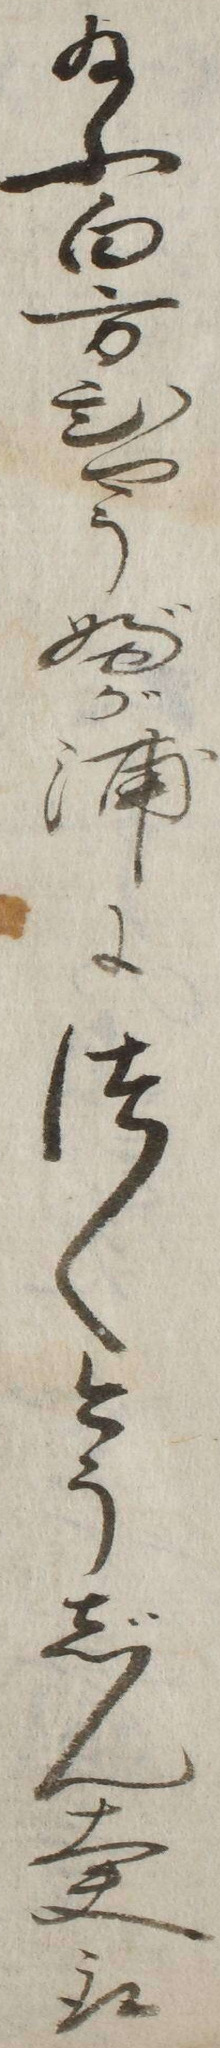給ふ白方ひやうぶが浦につくとうじん太夫取
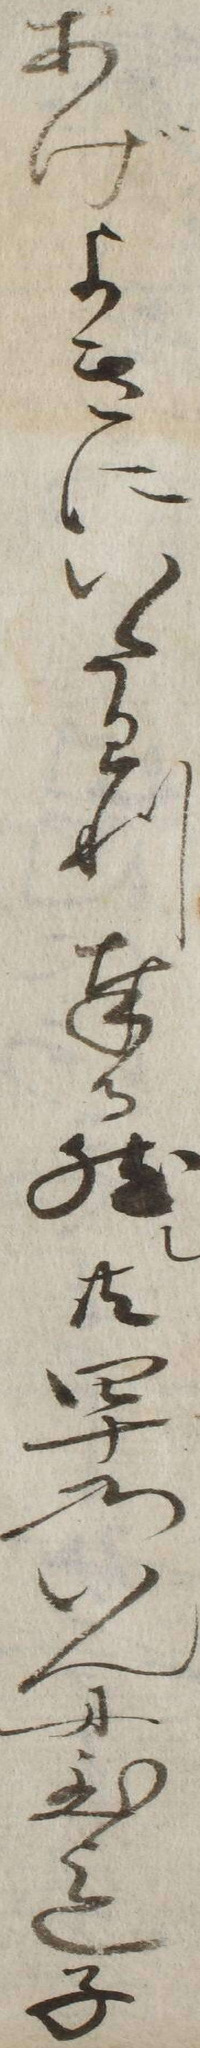あげよきにいたわり奉る然れ共畢？のいんに至迄子
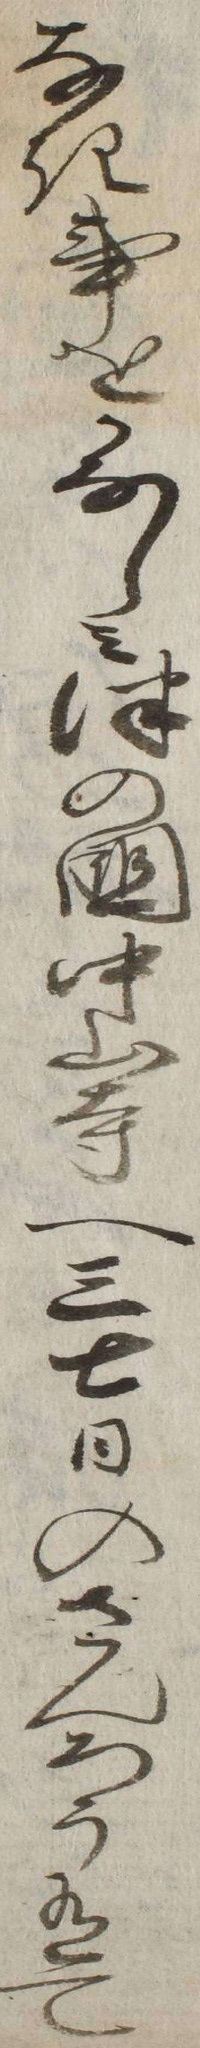なき事をかなしみ津の国中山寺へ三七日のさんろう有て
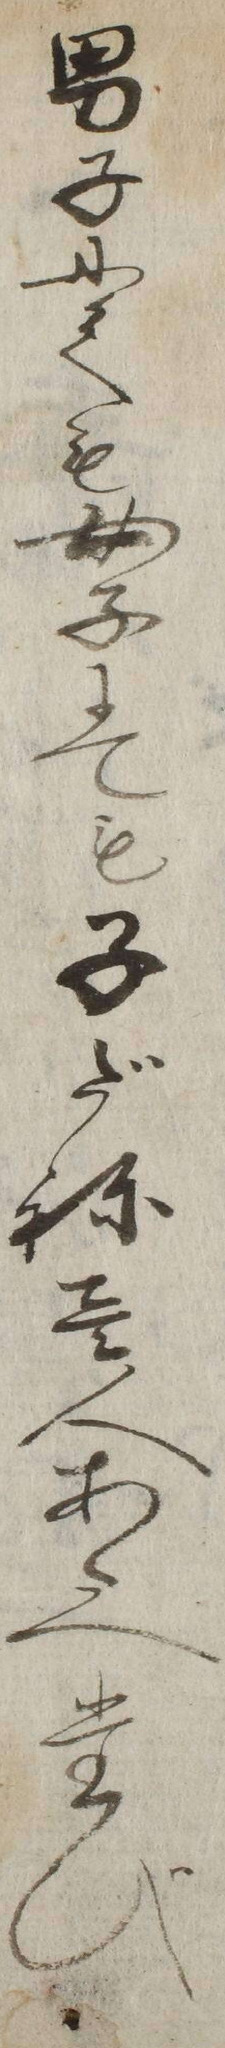男子にても女子にても子だね壱人あたへたび
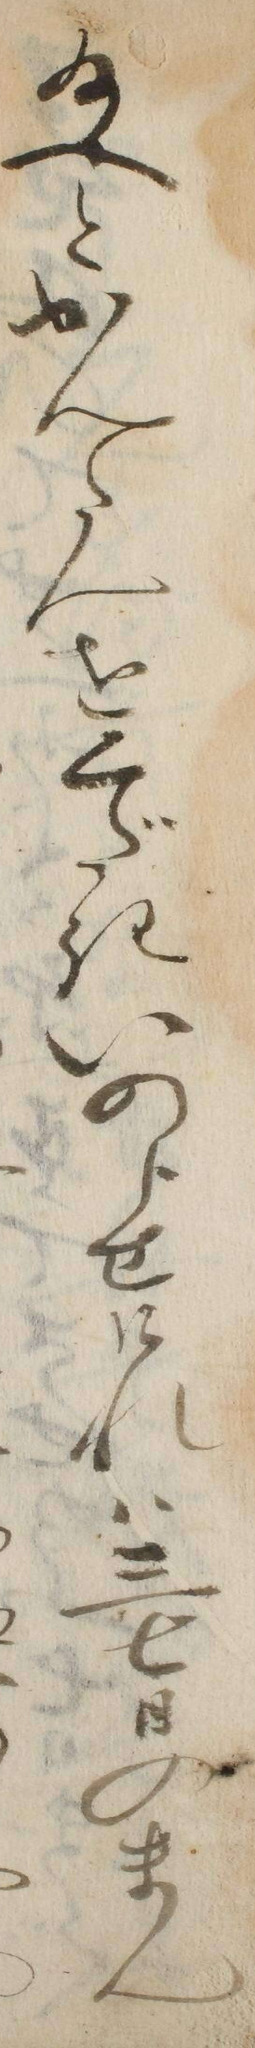給へとかんたんをくだきいのらせけれは三七日のまん
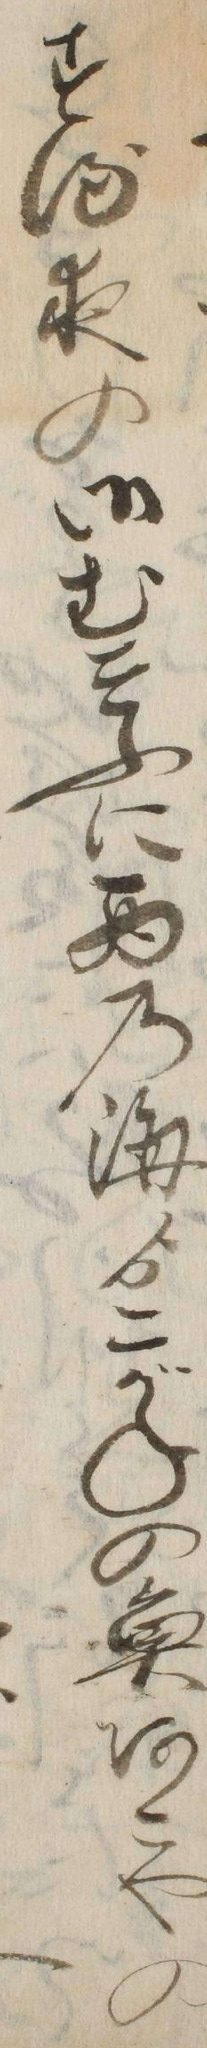する夜の御むそふに西の海よりこがねの魚あこやの
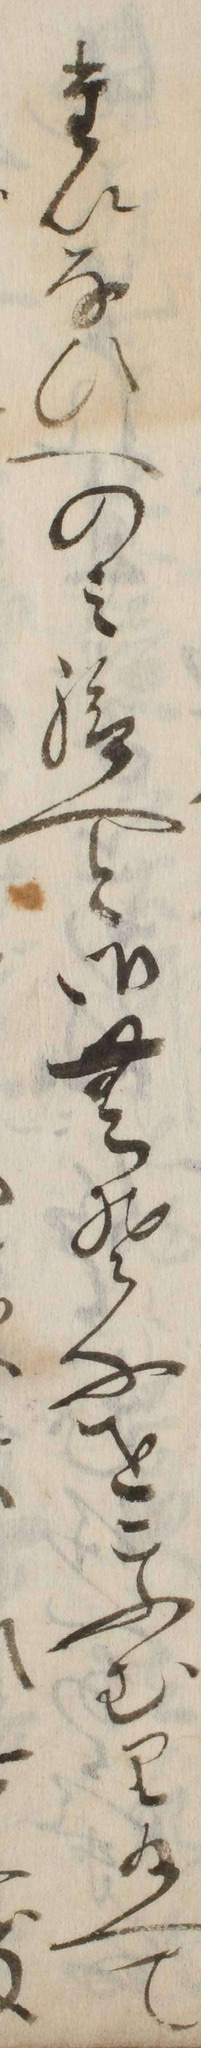たいなひへのみ給へと御むそふをこふむり給へて
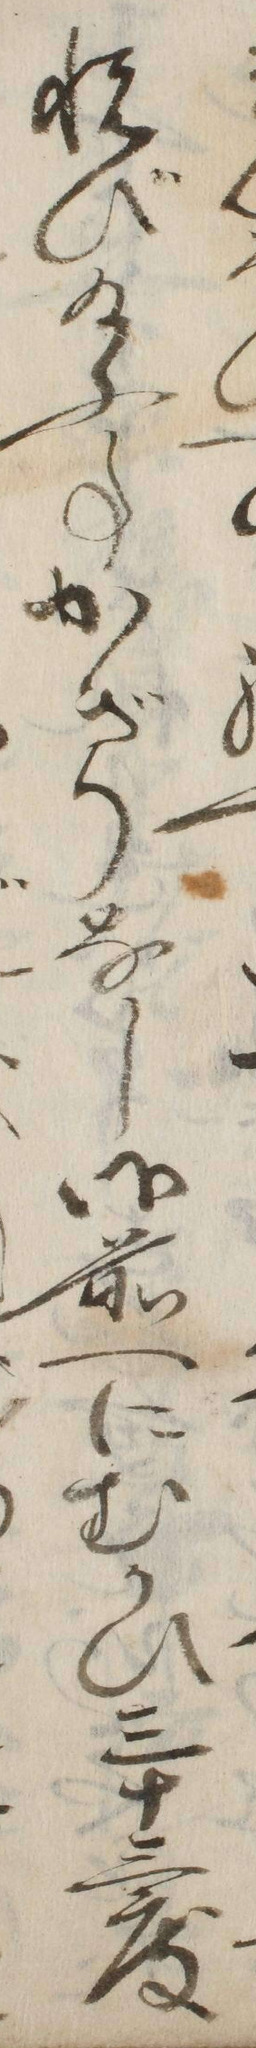悦び給ふ事かぎりをし御前へにむかひ三十三度
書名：奉弘法大師御傳記
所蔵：国文学研究資料館
